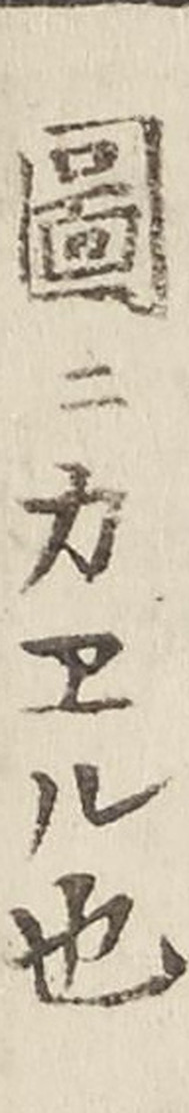図ニカヱル也

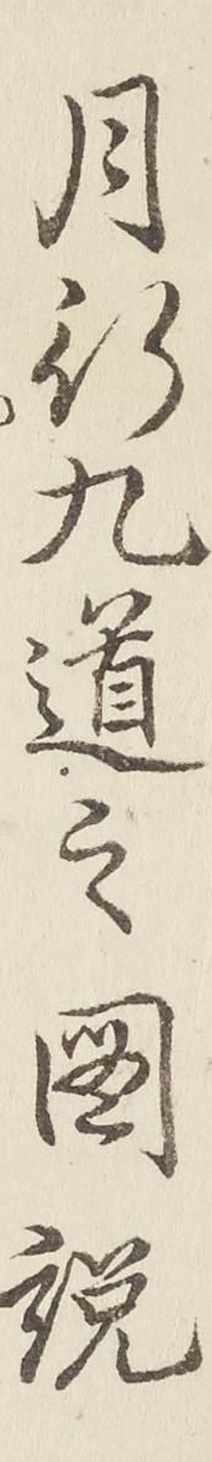月行九道之図説
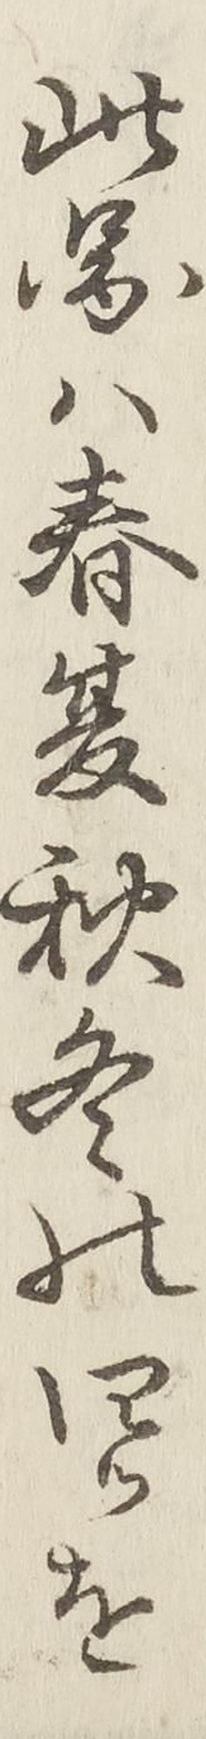此図は春夏秋冬の四ツを
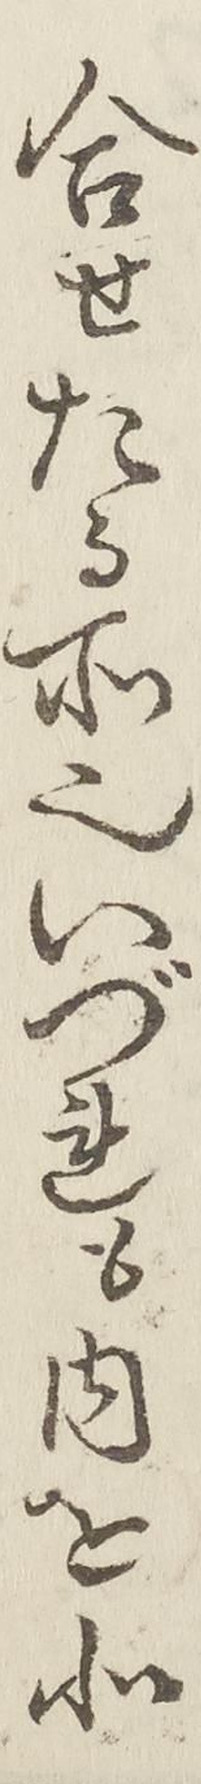合せたる所也いづれも内を北
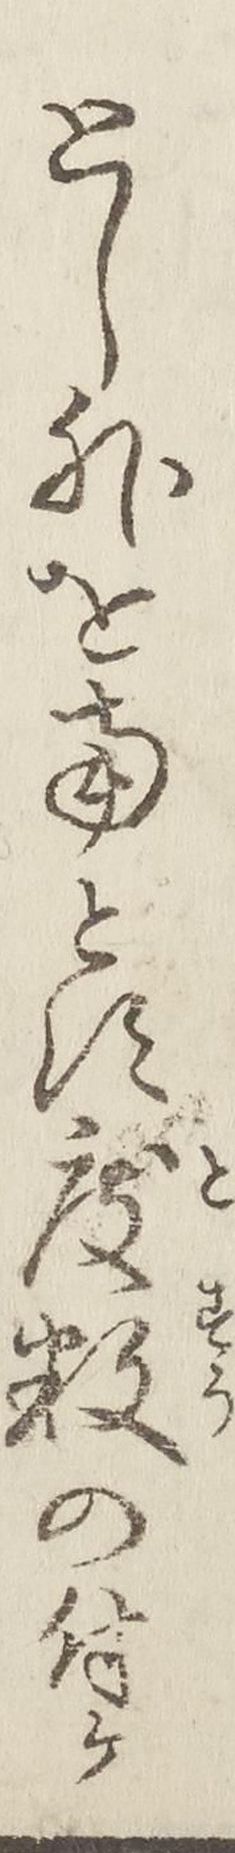とし外を南とす度数の付ケ
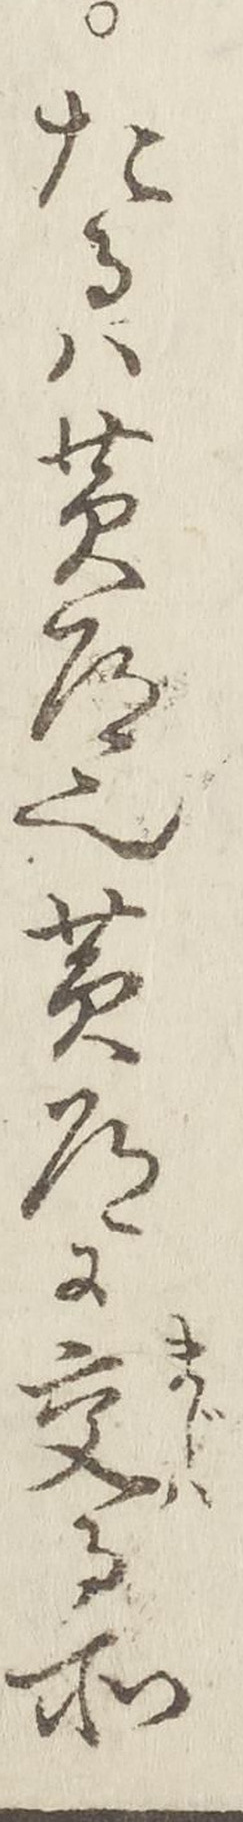たるは黄道也黄道に交る所
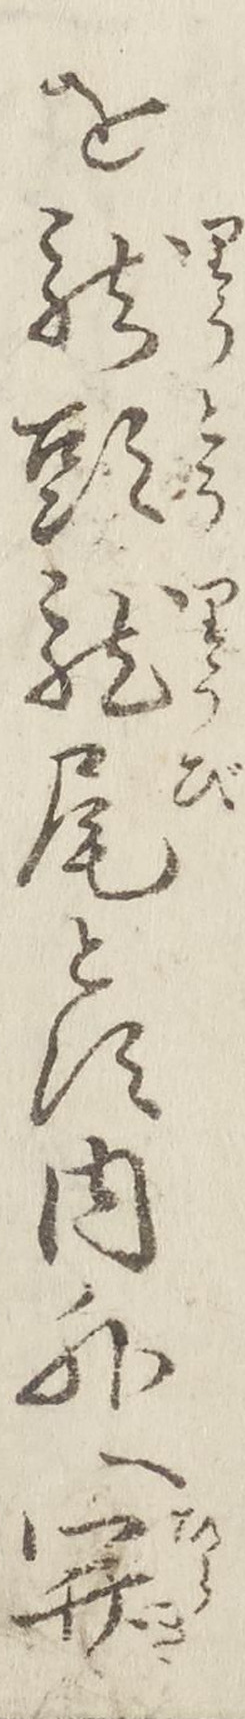を龍頭龍頭とす内外へ開
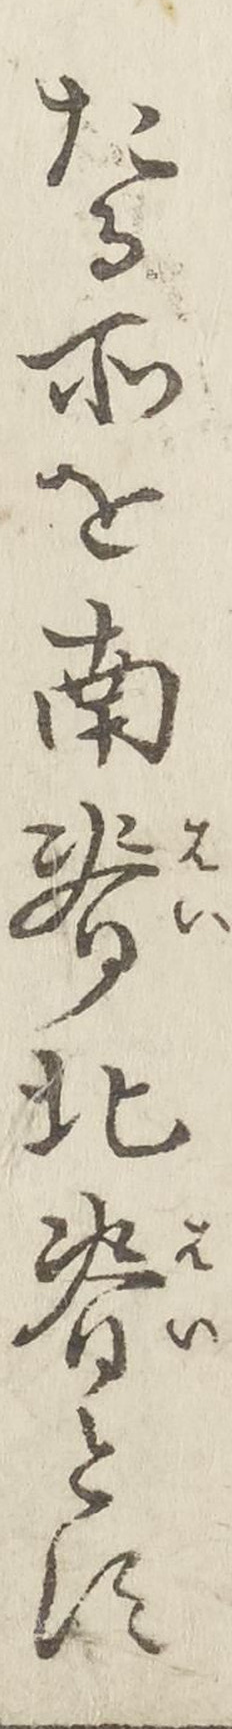たる所を南背北背とす
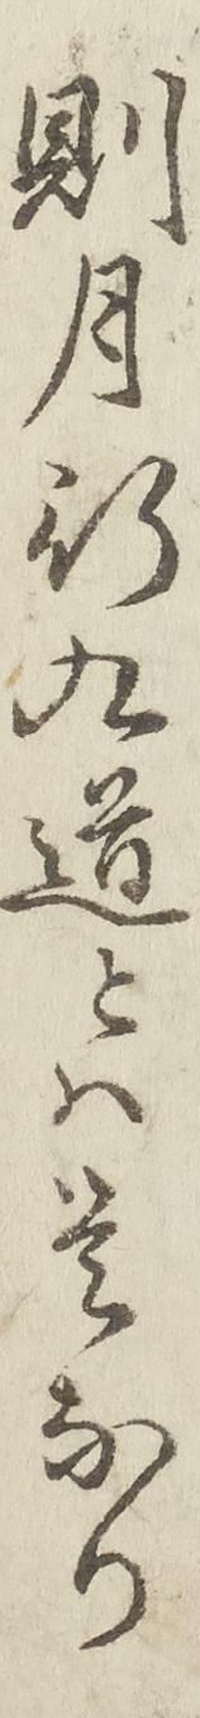則月行九道とは是なり

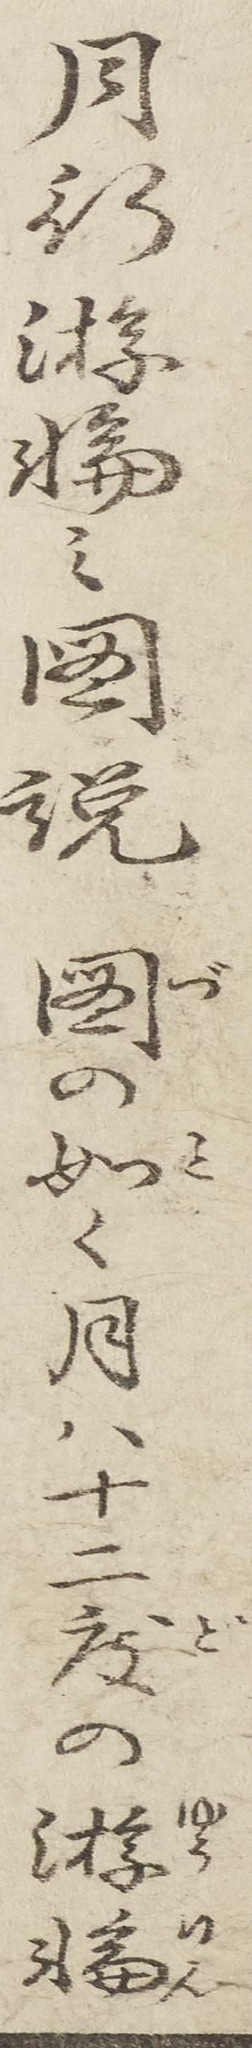月行游輪之図説図の如く月は十二度の游輪
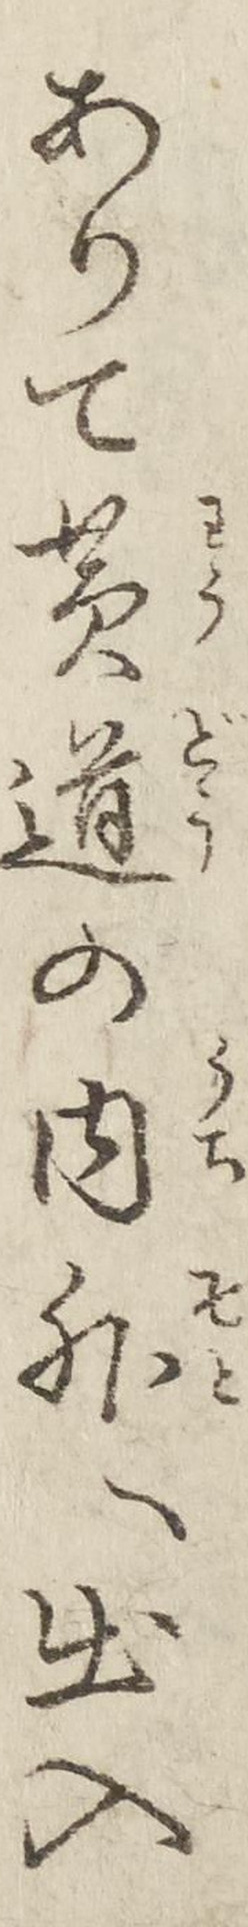ありて黄道の内外へ出入
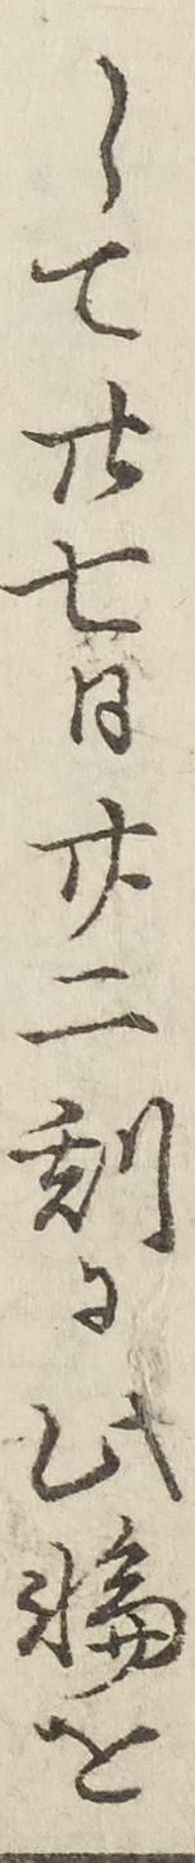して廿七日廿二刻に此輪を
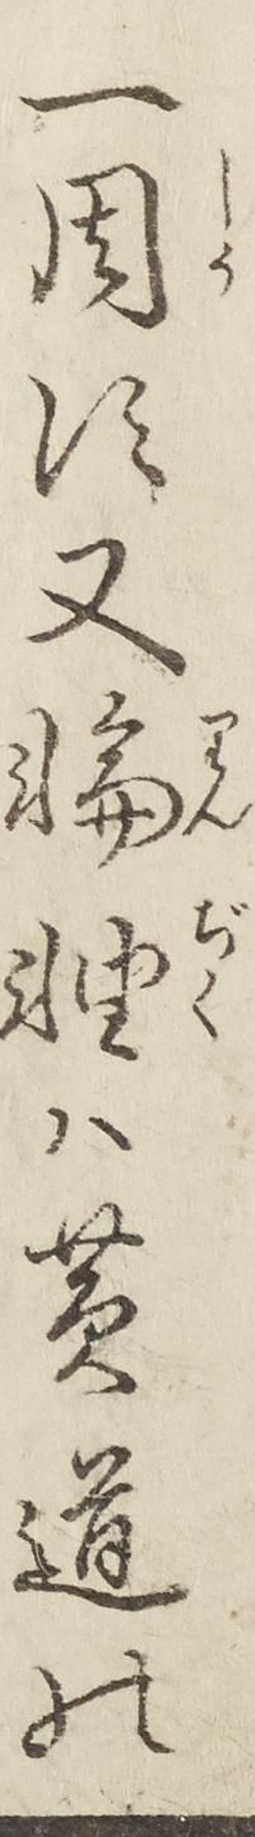一周す又輪軸は黄道の
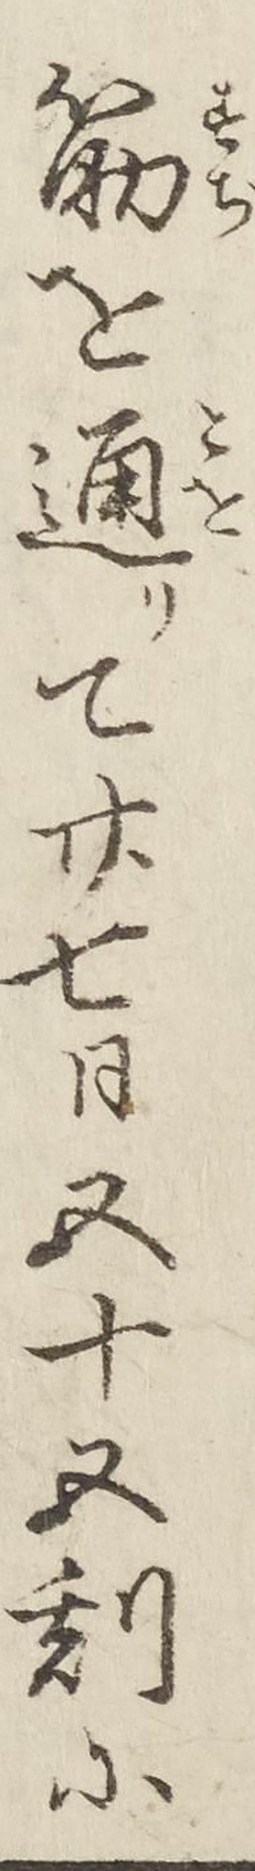筋を通りて廿七日五十五刻に
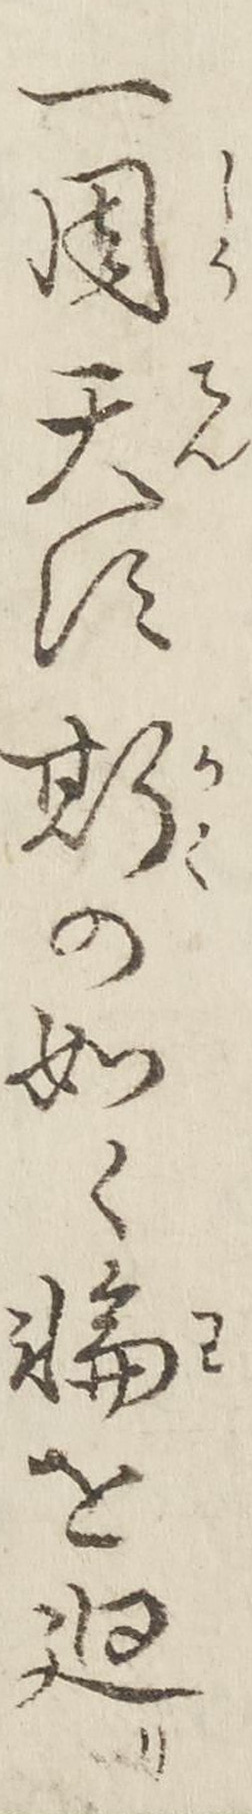一周天す斯の如く輪を廻り
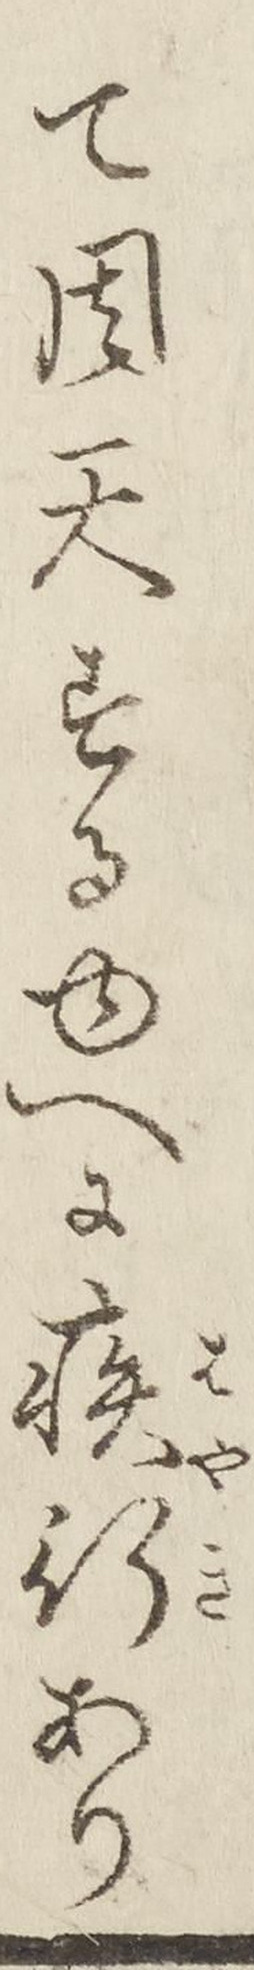て周天するゆへに疾行あり
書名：平天儀圖解
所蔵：東京大学地震研究所図書室 Earthquake Research Institute Library, The University of Tokyo, JAPAN
